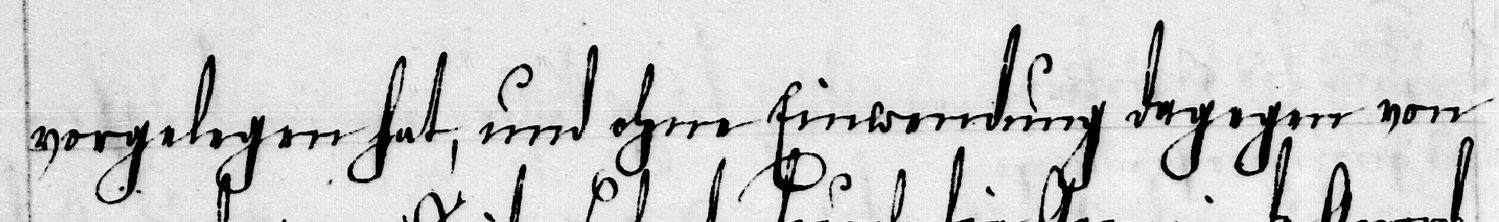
vorgelegen hat, und ohne Einwendung dagegen von
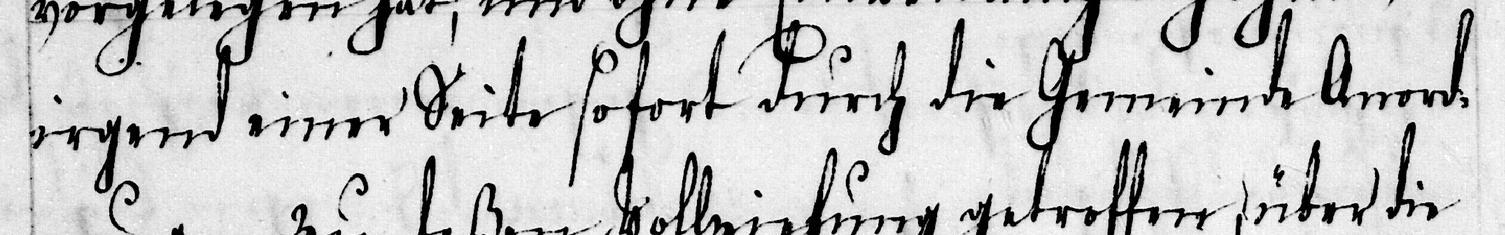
irgend einer Seite sofort durch die Gemeinde Anord¬
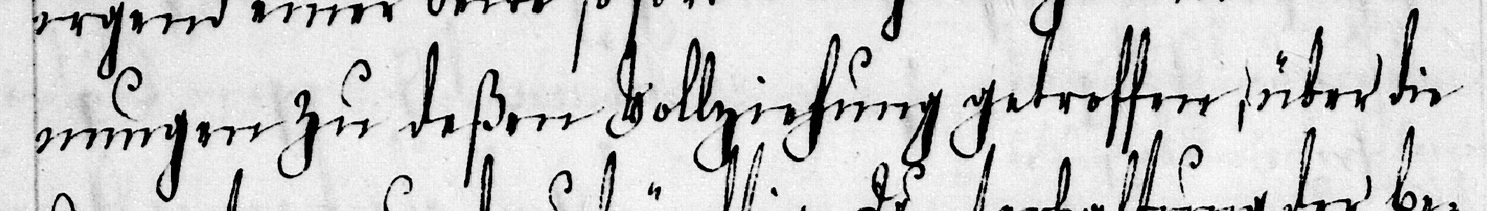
nungen zu deßen Vollziehung getroffen, über die
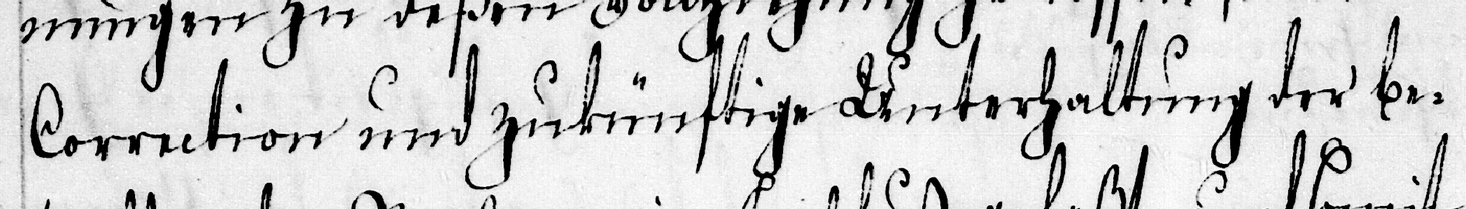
Correction und zukünftige Unterhaltung der be¬
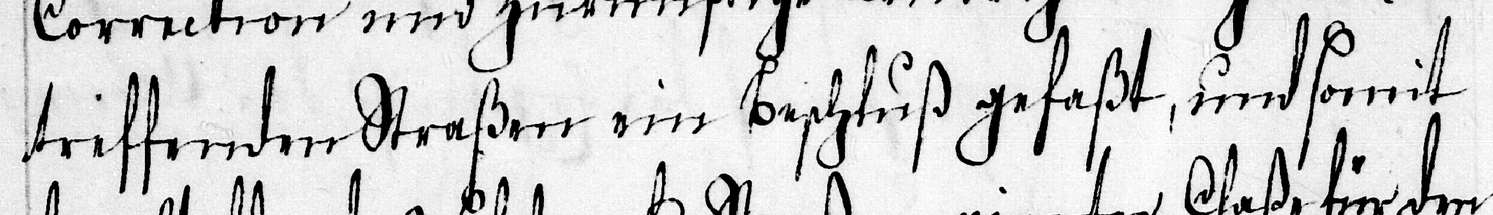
treffenden Straßen ein Beschluß gefaßt, und somit
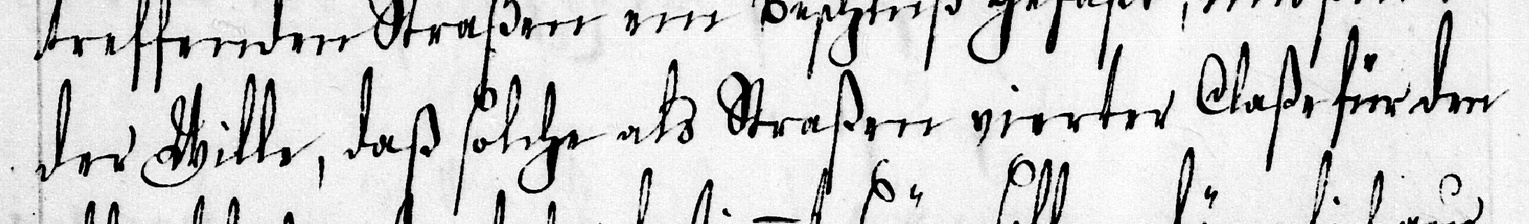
der Wille, daß solche als Straßen vierter Claße für den
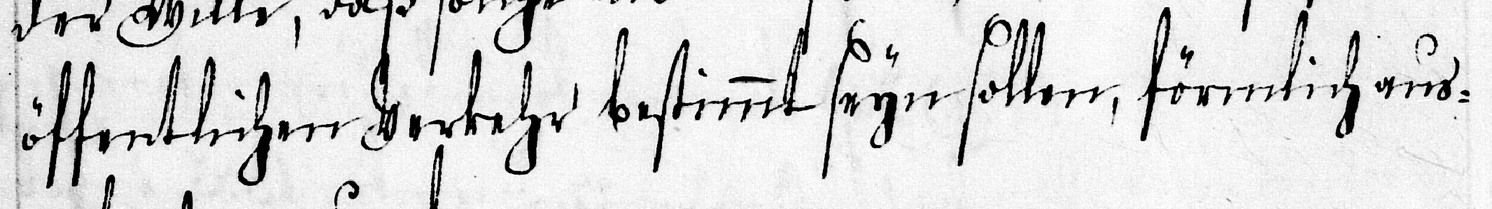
öffentlichen Verkehr bestimmt seyn sollen, förmlich aus¬
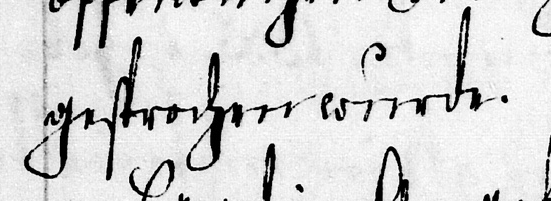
gesprochen wurde.
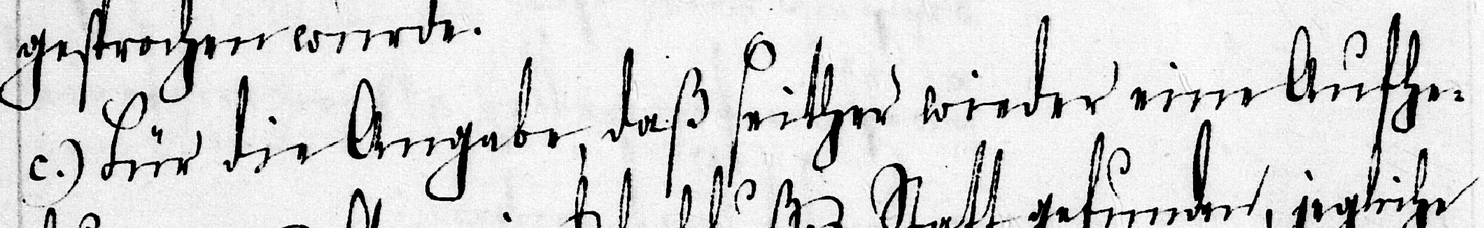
c.) Für die Angabe, daß seither wieder eine Aufhe¬
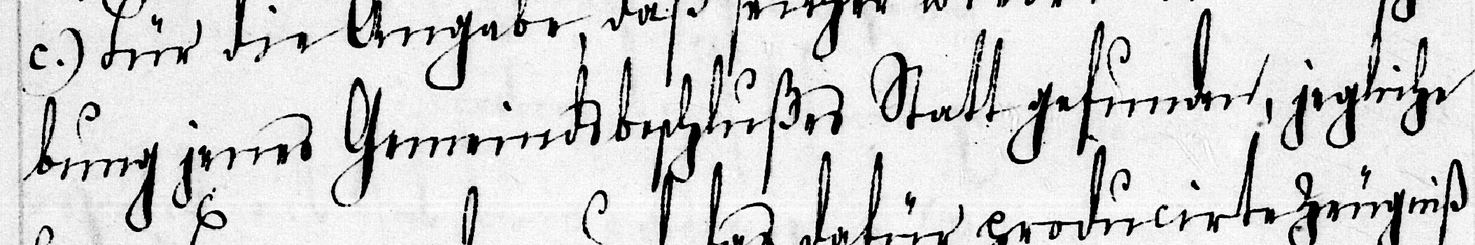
bung jenes Gemeindsbeschlußes Statt gefunden, jegliche
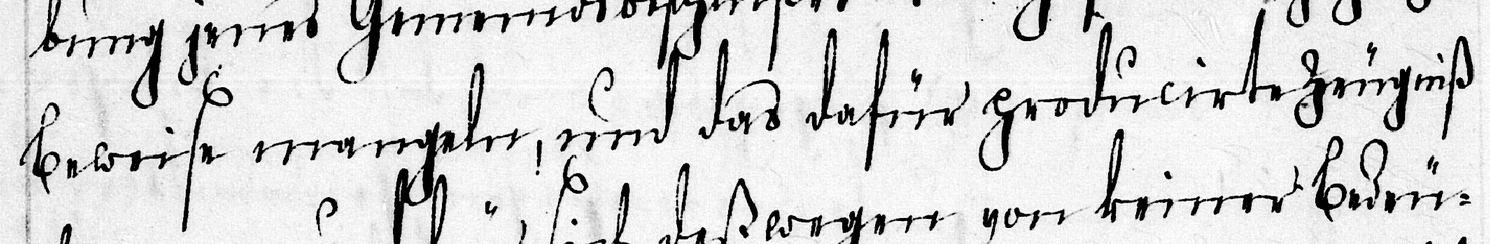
Beweise mangeln, und das dafür producirte Zeugniß
